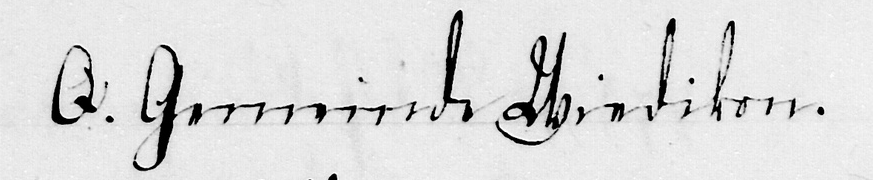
Q. Gemeinde Wiedikon.
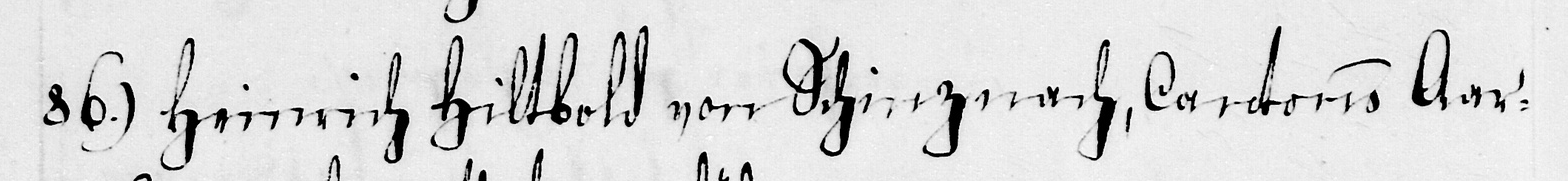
86.) Heinrich Hiltbold von Schinznach, Cantons Aar¬
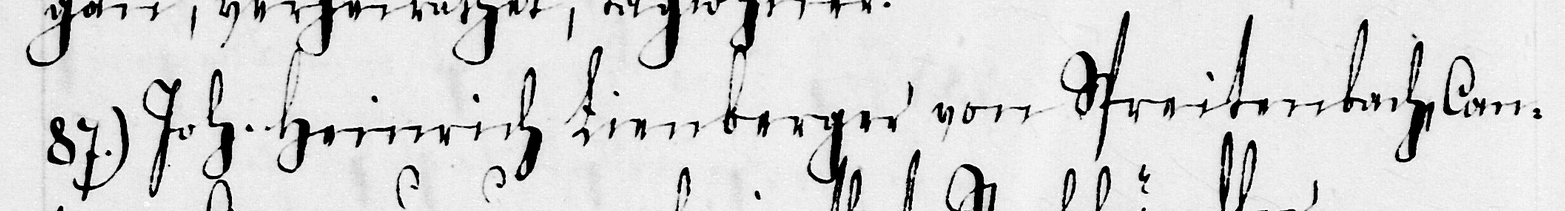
87.) Joh. Heinrich Lienberger von Spreitenbach, Can¬
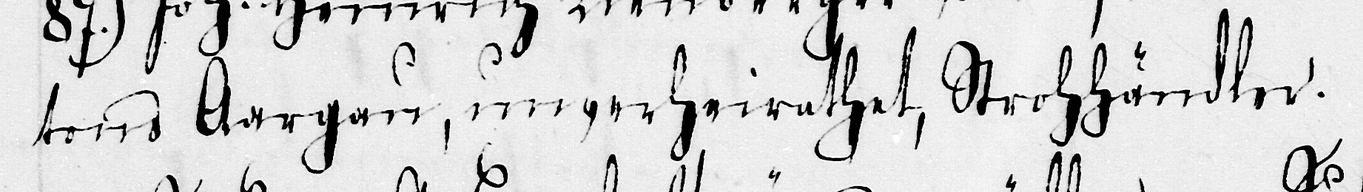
tons Aargau, unverheirathet, Strohhändler.
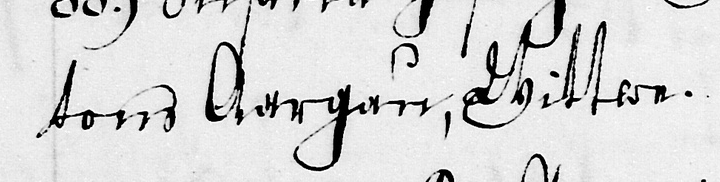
tons Aargau, Wittwe.
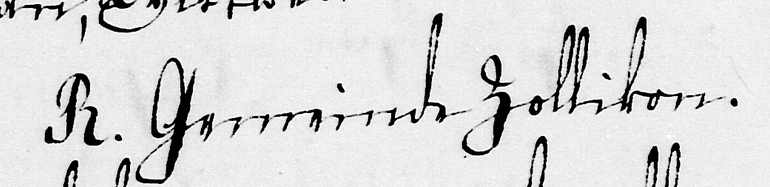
R. Gemeinde Zollikon.
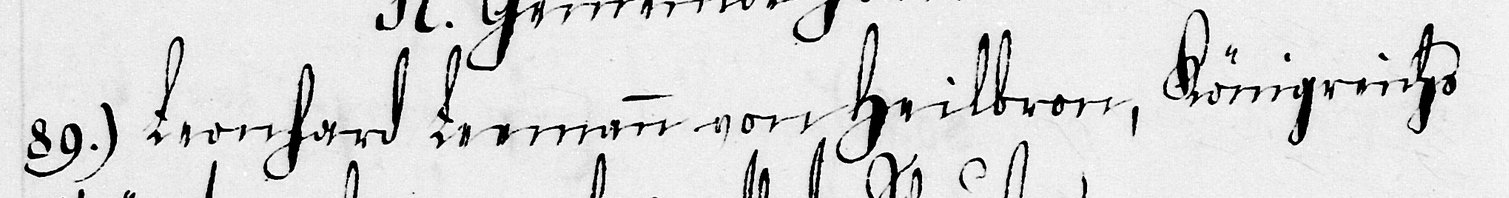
89.) Leonhard Leemann von Heilbron, Königreichs
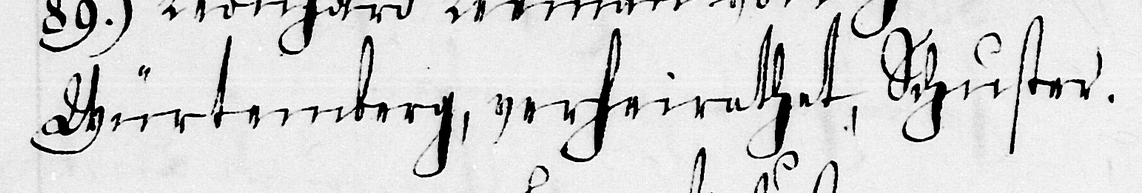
Würtemberg, verheirathet, Schuster.
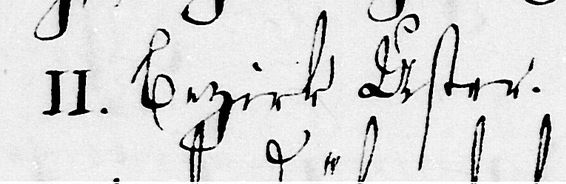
II. Bezirk Uster.
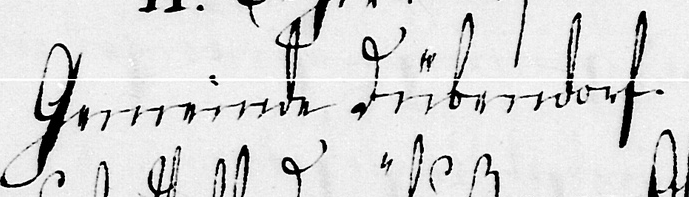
Gemeinde Dübendorf.
